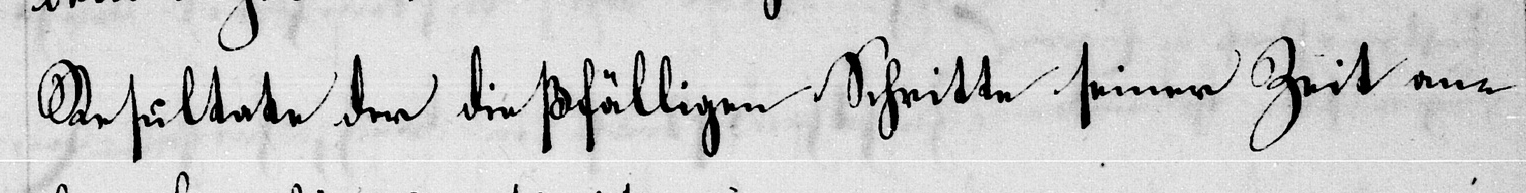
Resultate der dießfälligen Schritte seiner Zeit an¬
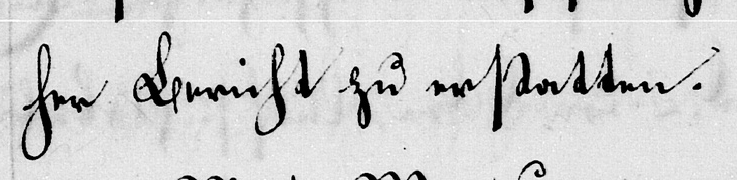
her Bericht zu erstatten.
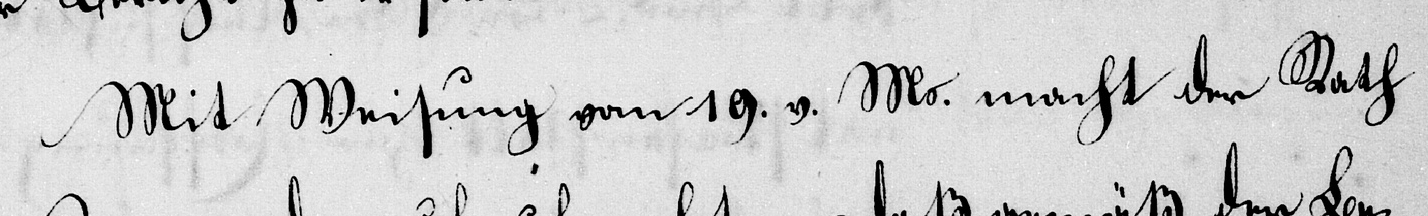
Mit Weisung vom 19. v. Ms. macht der Rath
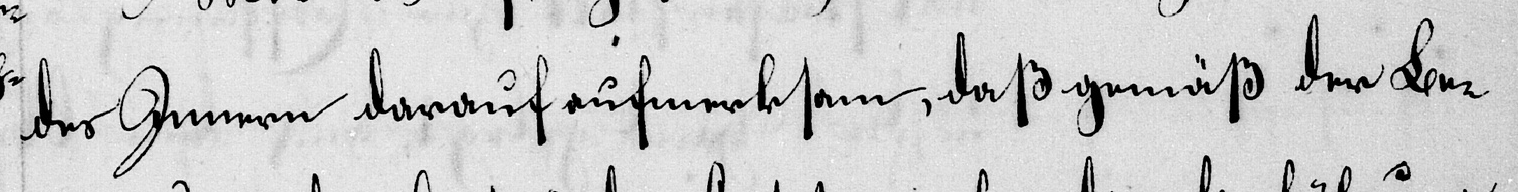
des Innern darauf aufmerksam, daß gemäß der Be¬
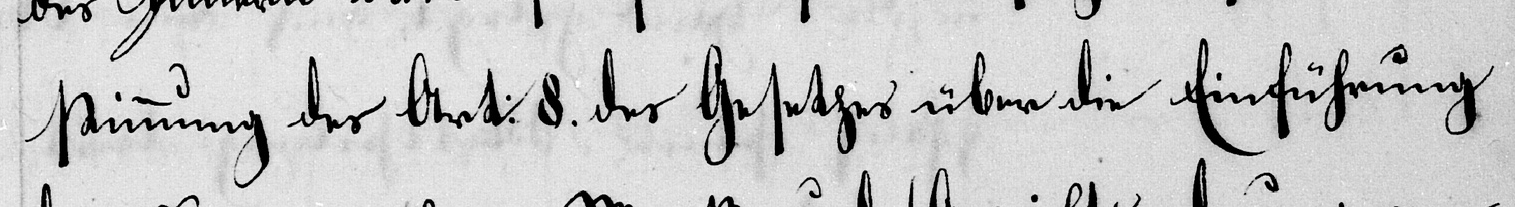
stimmung des Art: 8. des Gesetzes über die Einführung
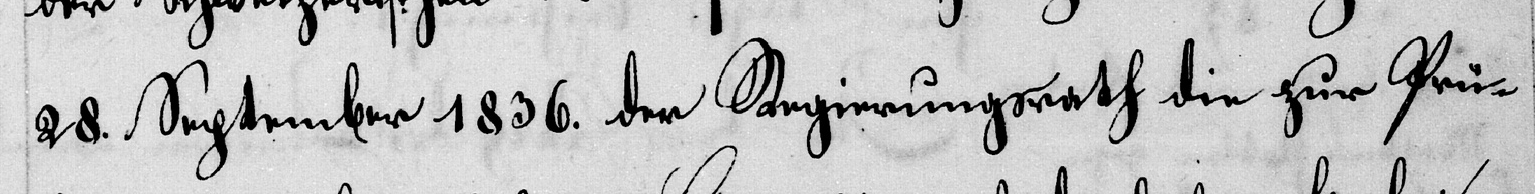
28. September 1836. der Regierungsrath die zur Prü¬
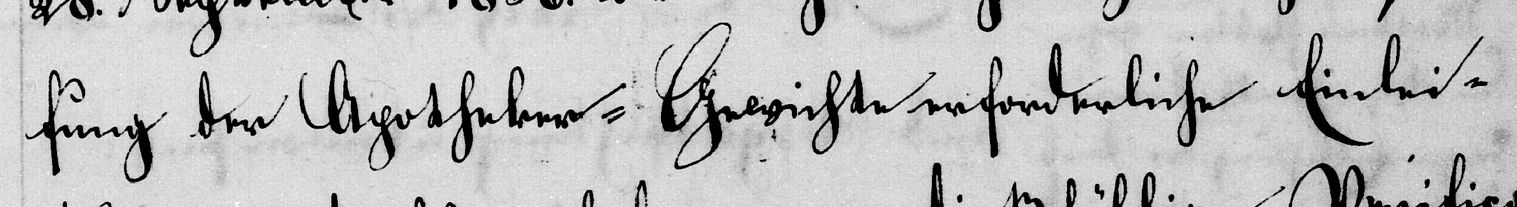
fung der Apotheken-Gewichte erforderliche Einlei¬
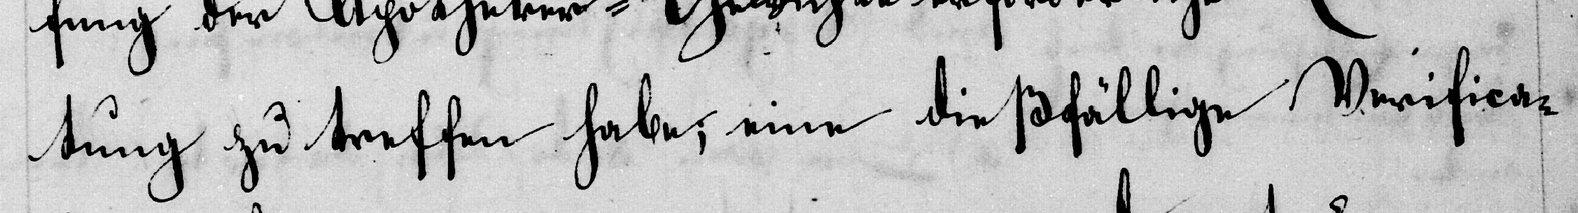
tung zu treffen habe; eine dießfällige Verifica¬
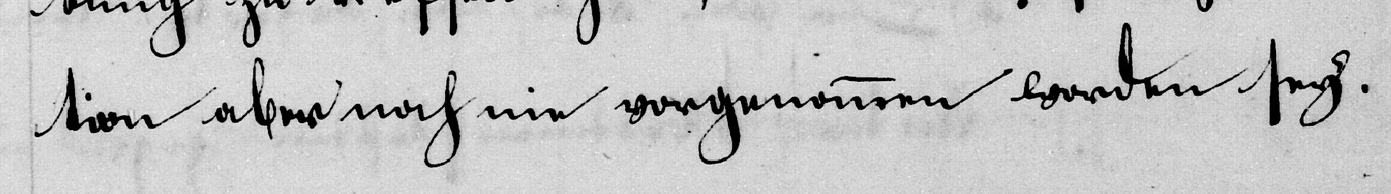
tion aber noch nie vorgenommen worden sey.
